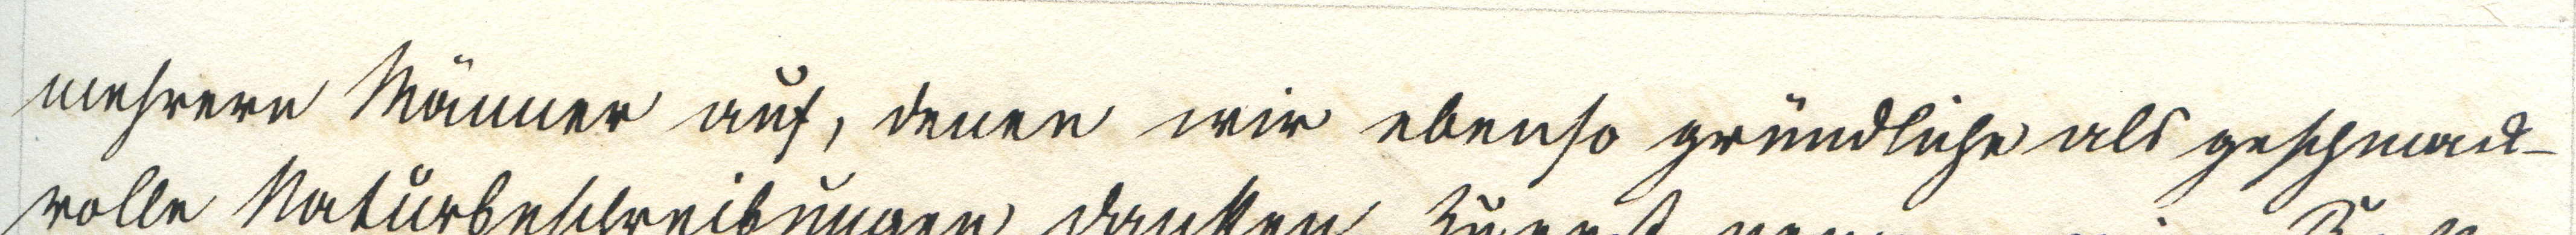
mehrere Männer auf, denen wir ebenso gründliche als geschmack-
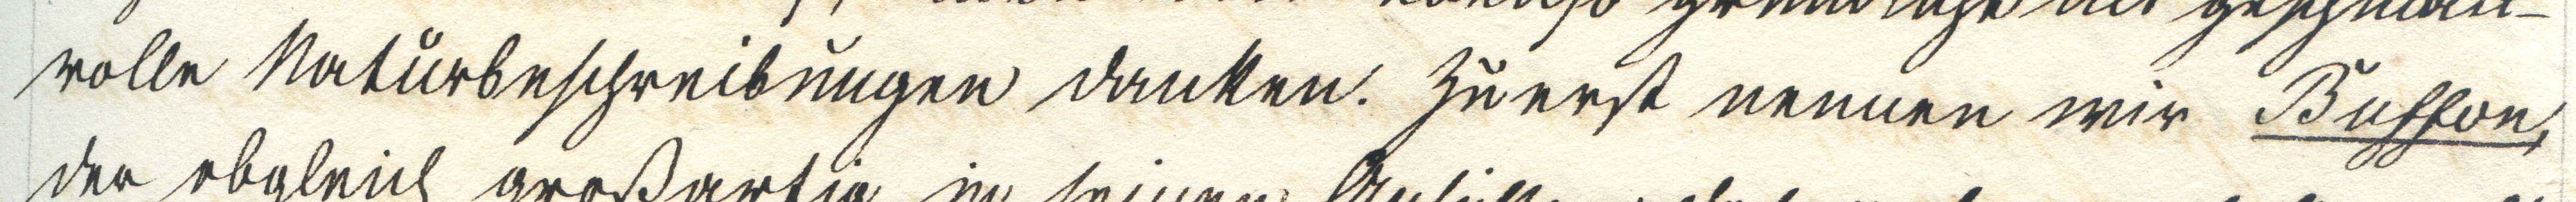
volle Naturbeschreibungen danken. Zuerst nennen wir Buffon,
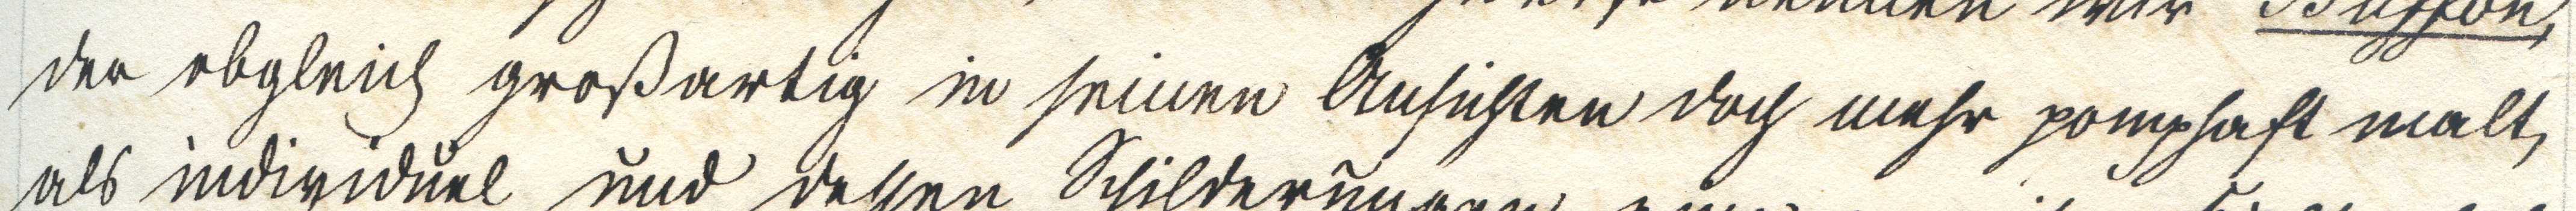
der obgleich großartig in seinen Ansichten doch mehr pomphaft malt,
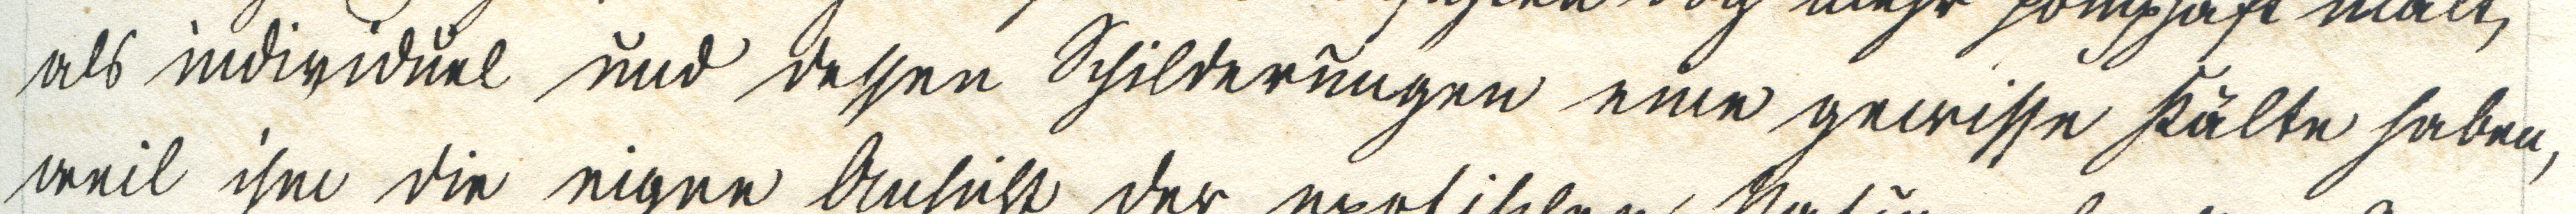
als individuel und dessen Schilderungen eine gewisse Kälte haben,
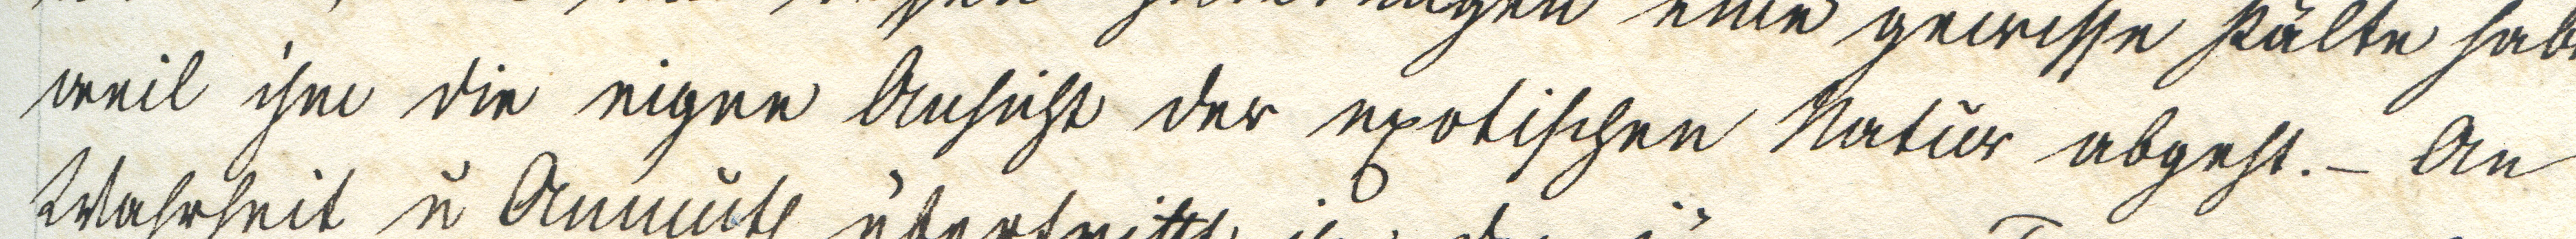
weil ihm die eigne Ansicht der exotischen Natur abgeht. – An
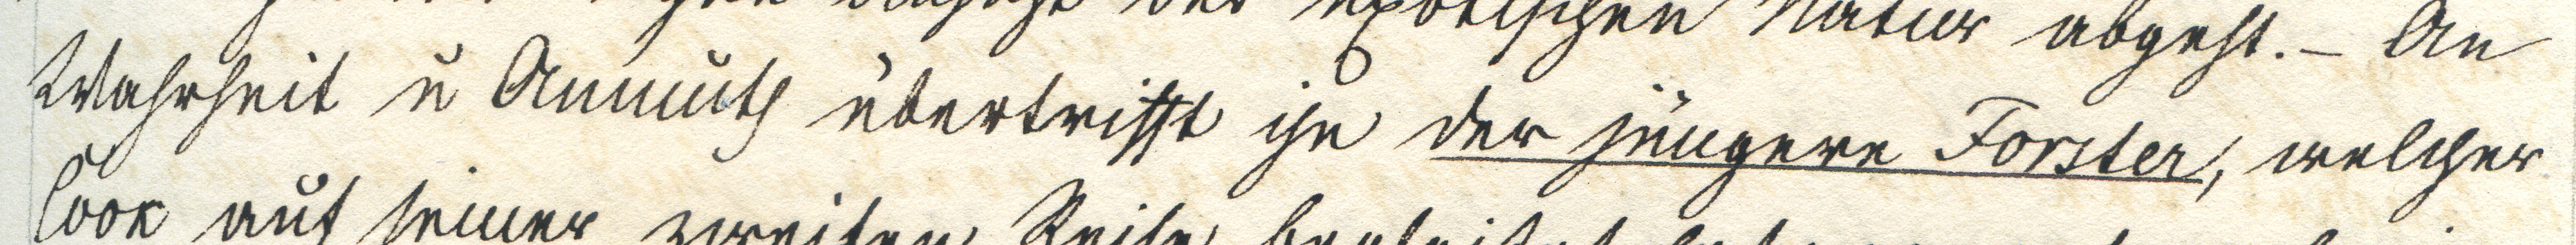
Wahrheit u Anmuth übertrifft ihn der jüngere Forster, welcher
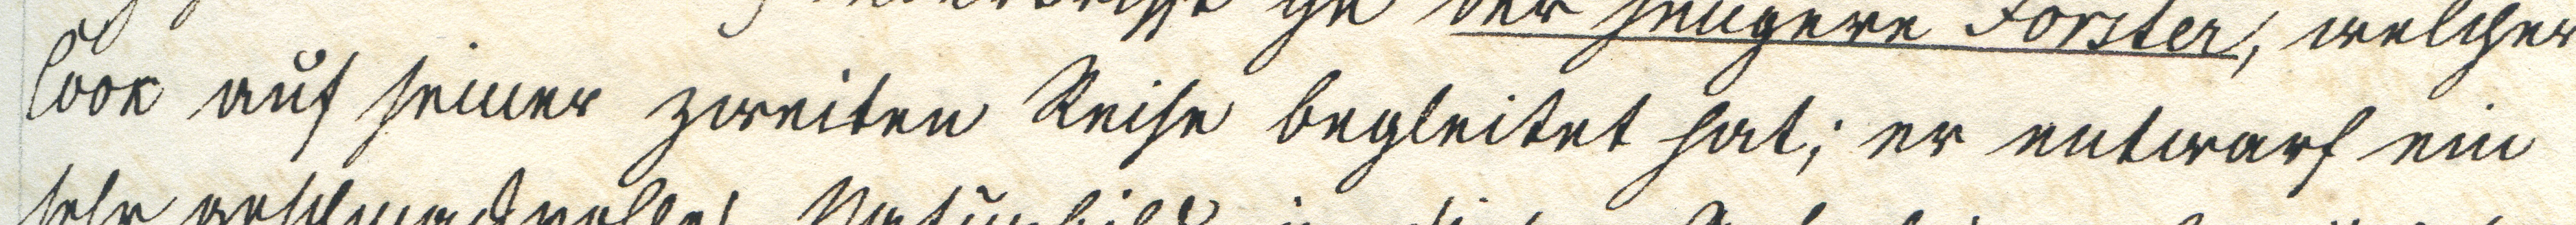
Cook auf seiner zweiten Reise begleitet hat; er entwarf ein
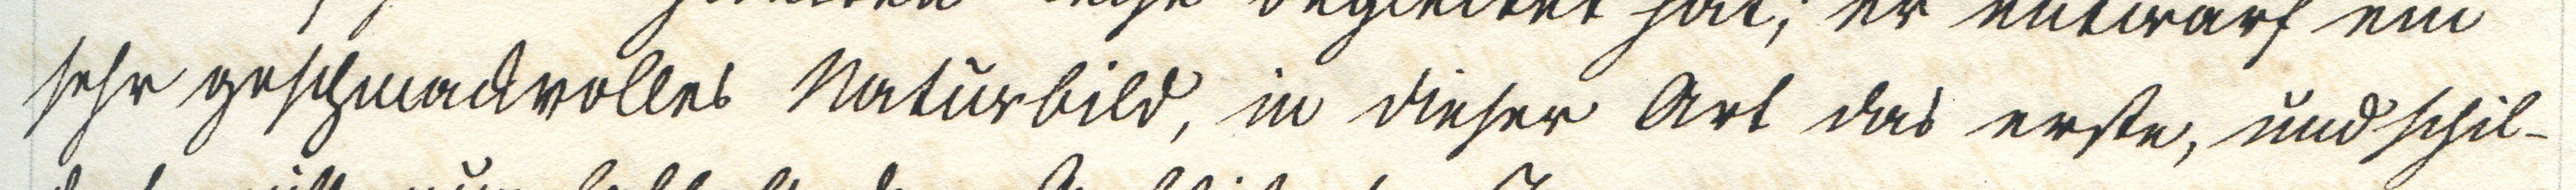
sehr geschmackvolles Naturbild, in dieser Art das erste, und schil-
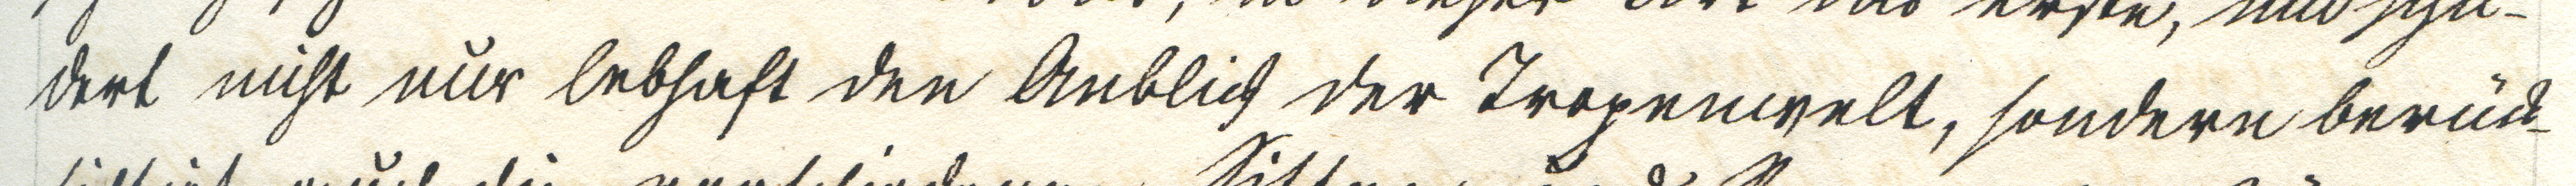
dert nicht nur lebhaft den Anblick der Tropenwelt, sondern berück-
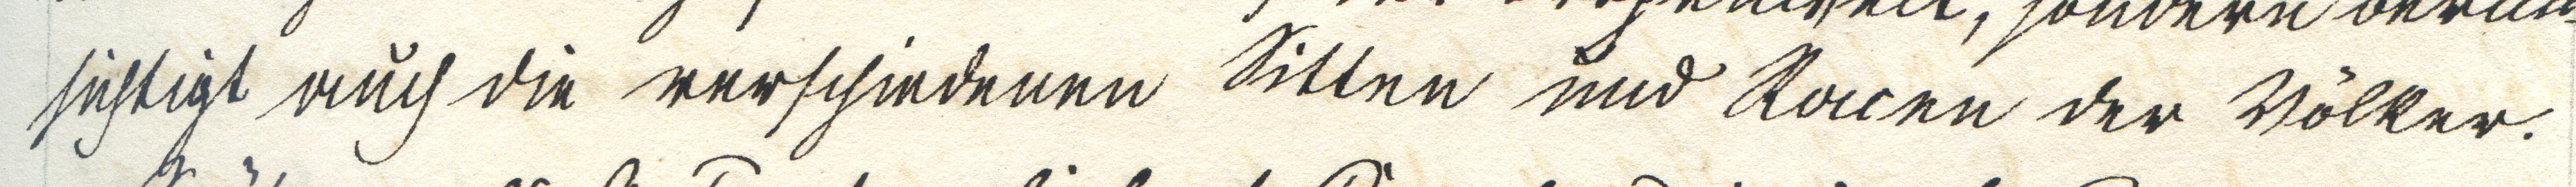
sichtigt auch die verschiedenen Sitten und Racen der Völker.
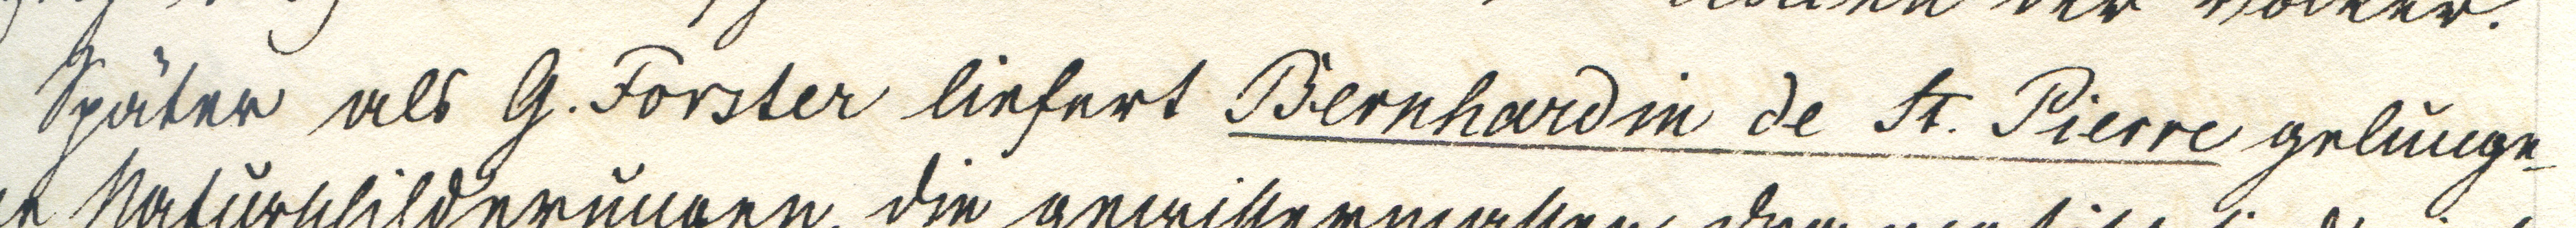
Später als G. Forster liefert Bernhardin de St. Pierre gelunge-
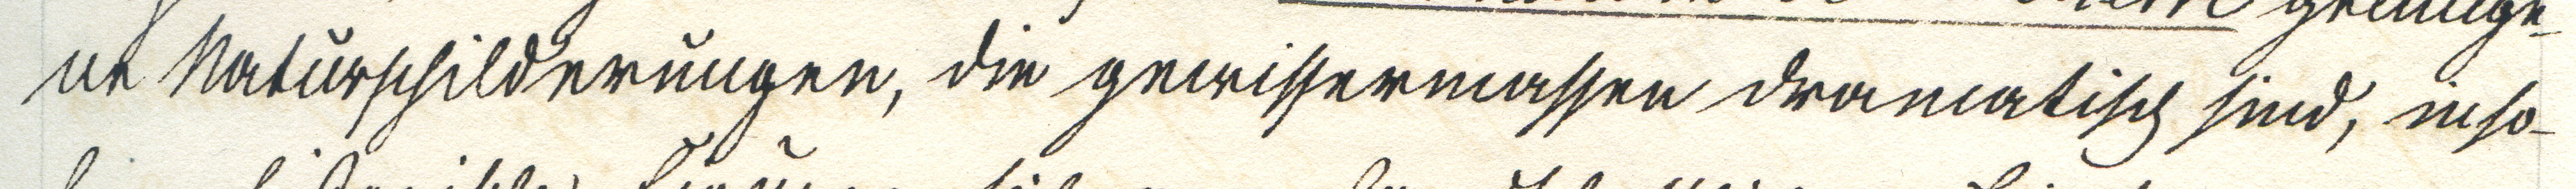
ne Naturschilderungen, die gewissermassen dramatisch sind, inso-
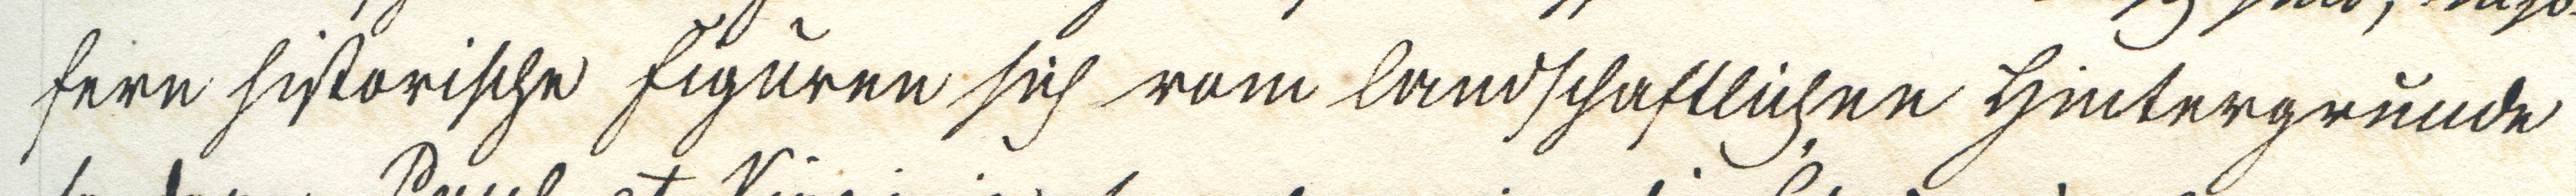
fern historische Figuren sich vom landschaftlichen Hintergrunde
